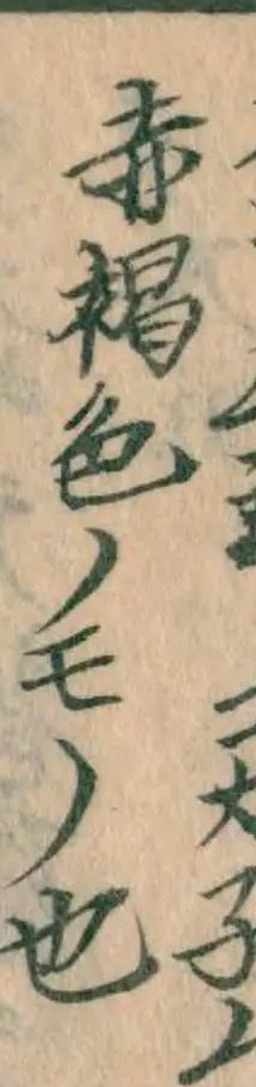赤褐色ノモノ也

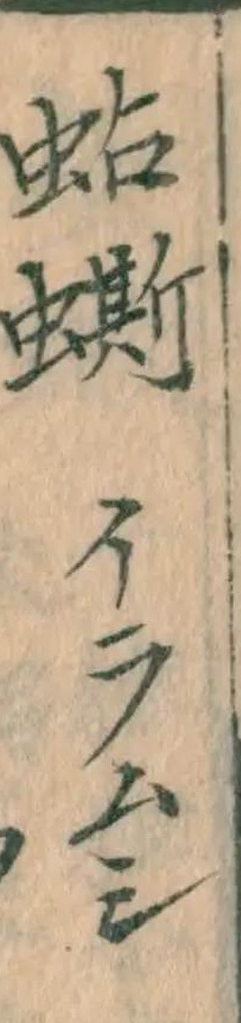蛅蟖イラムシ
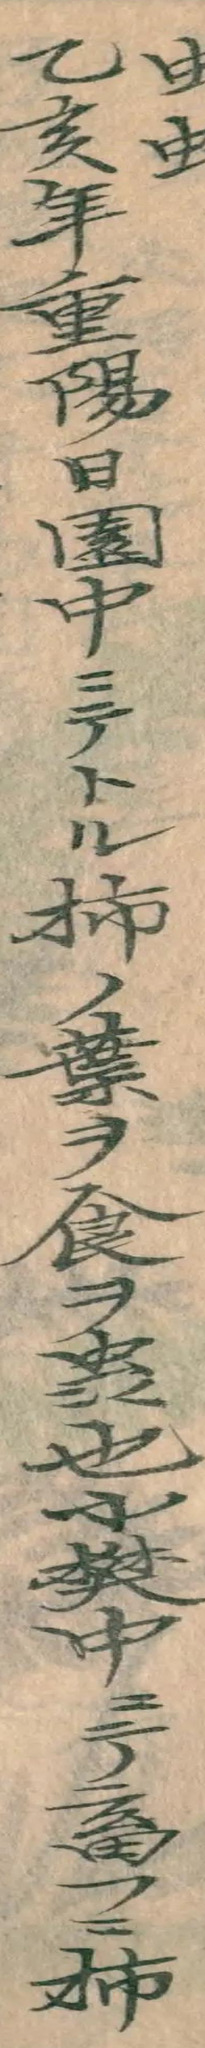乙亥年重陽日園中ニテトル柿ノ葉ヲ食ヲ虫也小焚中ニテ畜フニ柿
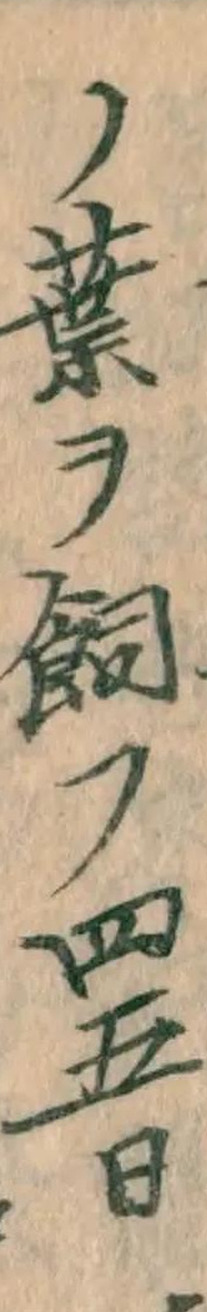ノ葉ヲ飼フ四五日
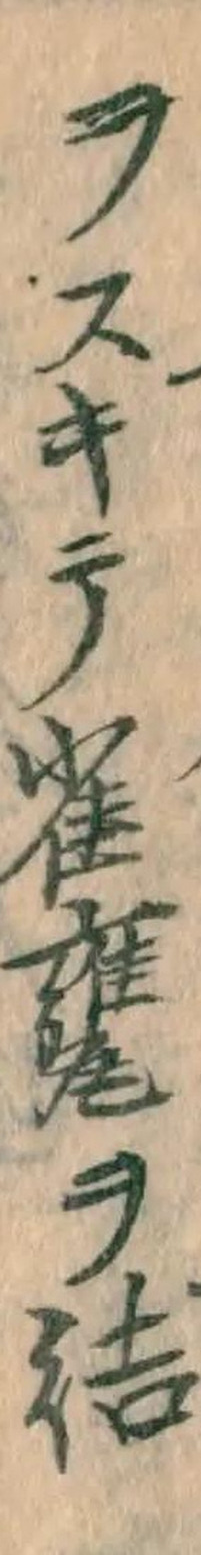ヲスキテ雀甕ヲ結
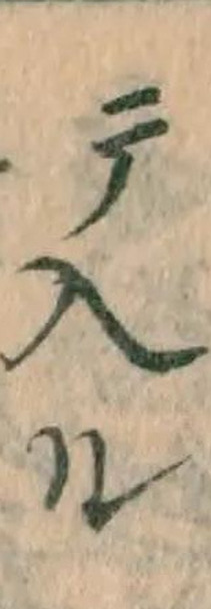テ入ル
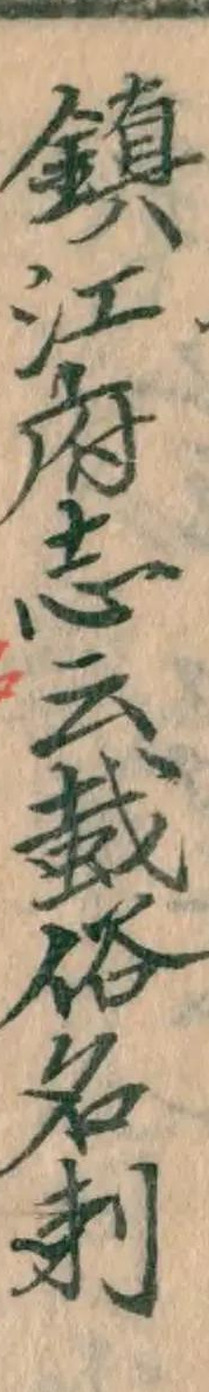鎮江府志云蛓俗名刺
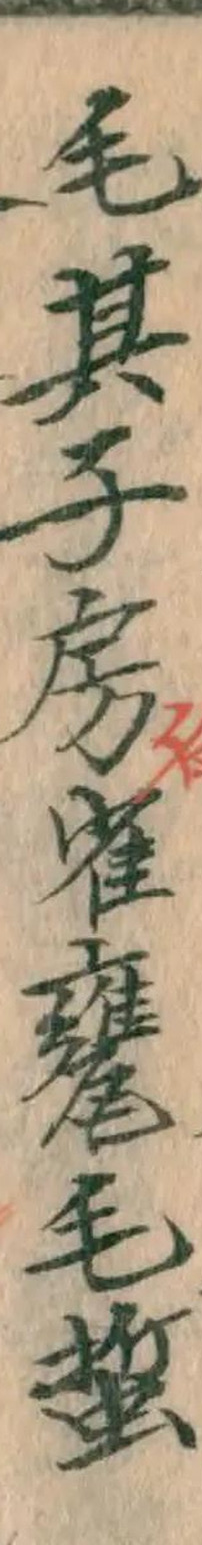毛其子房名雀甕毛蜇
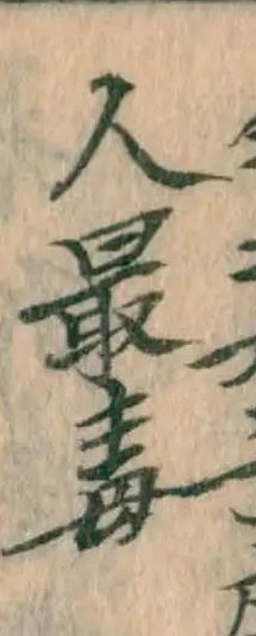人最毒
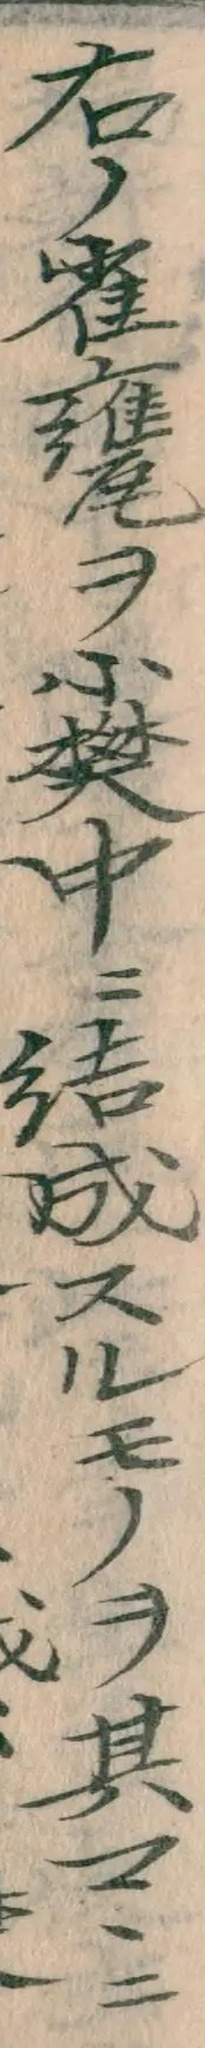右ノ雀甕ヲ小焚中ニ結成スルモノヲ其マヽニ
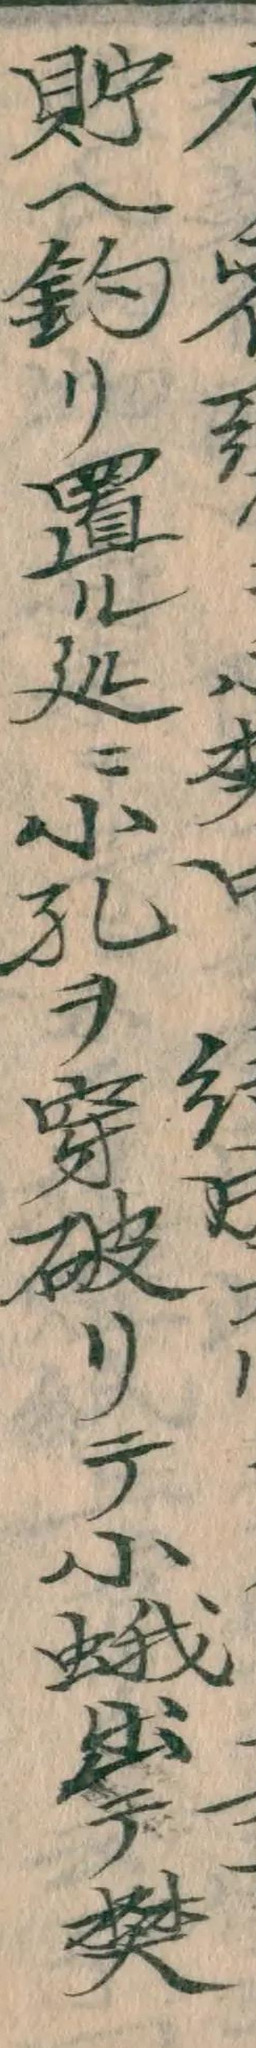貯ヘ釣リ置ル処ニ小孔ヲ穿破リテ小蛾出テ焚
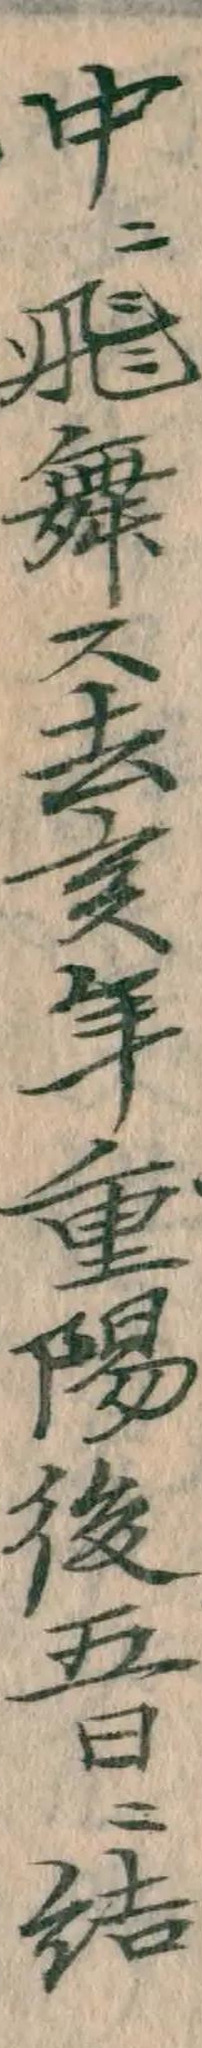中ニ飛舞ス去亥年重陽後五日ニ結
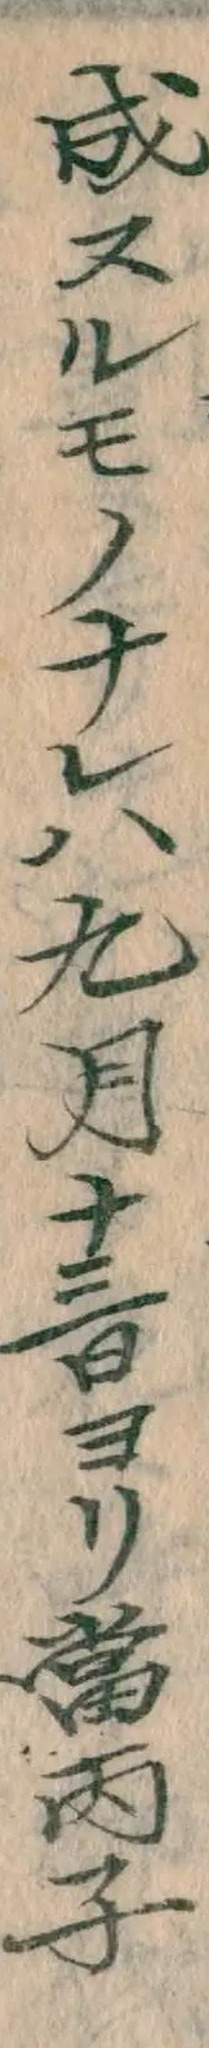成スルモノナレハ九月十三日ヨリ当丙子
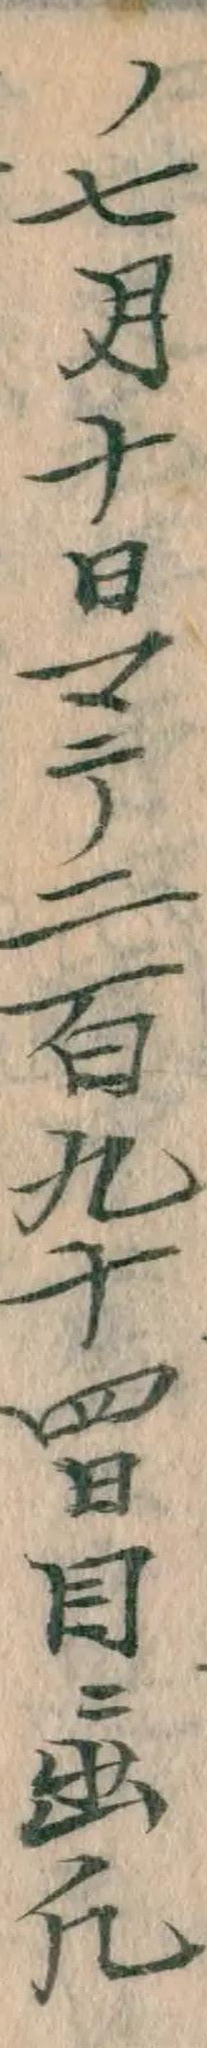ノ七月十日マテ二百九十四日目ニ出凡
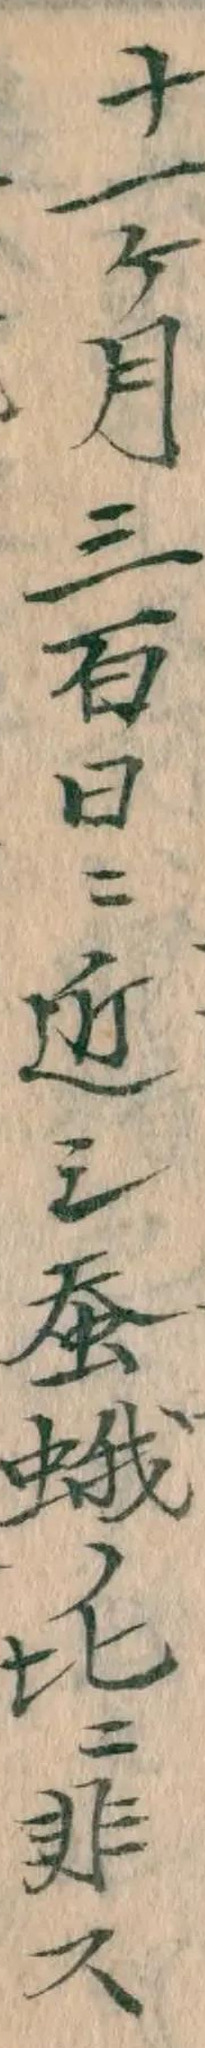十一ヶ月三百日ニ近シ蚕蛾ノ比ニ非ス
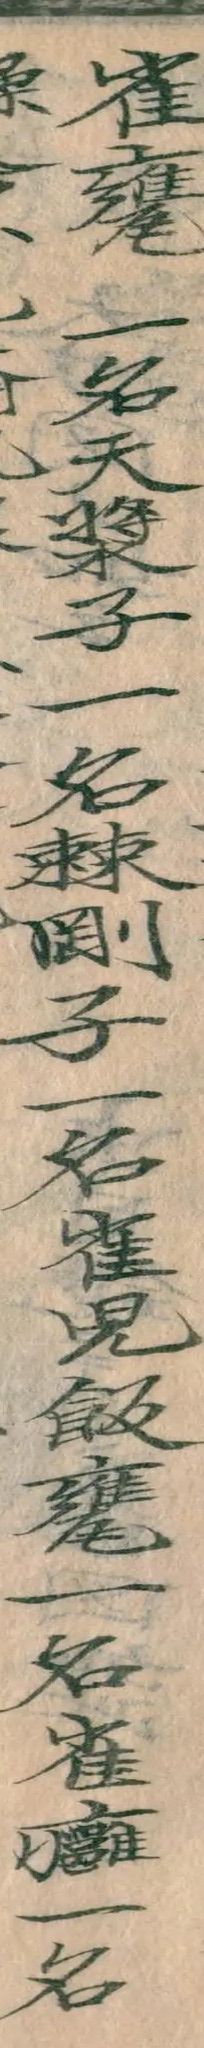雀甕一名天漿子一名棘剛子一名雀児飯甕一名雀癰一名
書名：千蟲譜 3巻. [3]
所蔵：国立国会図書館 National Diet Library, JAPAN
